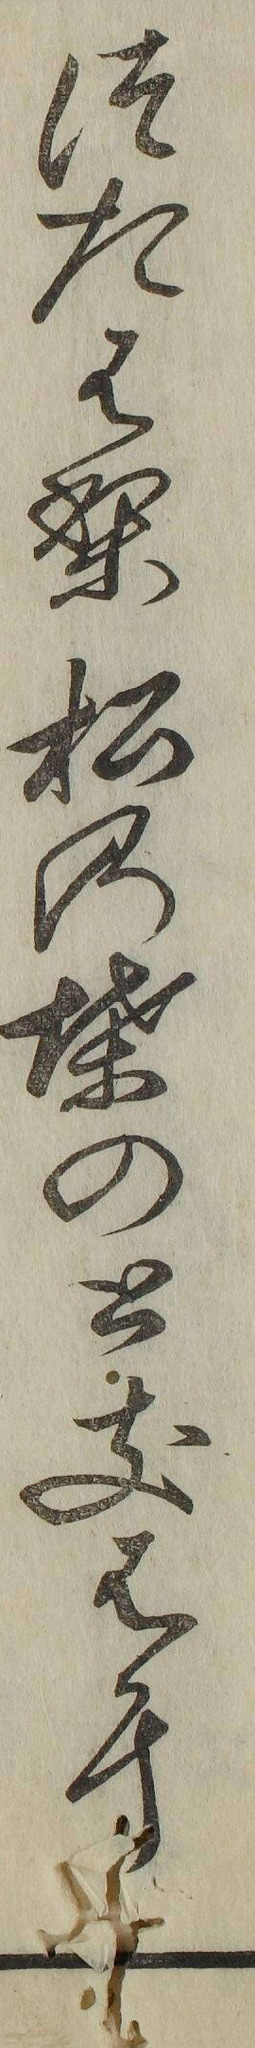つたはり松ののときはに
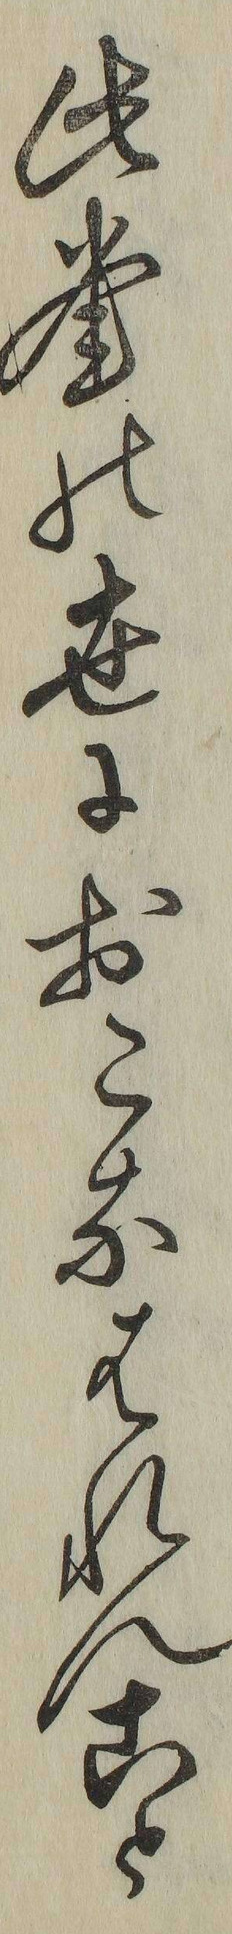此當の世におこなはれんこと
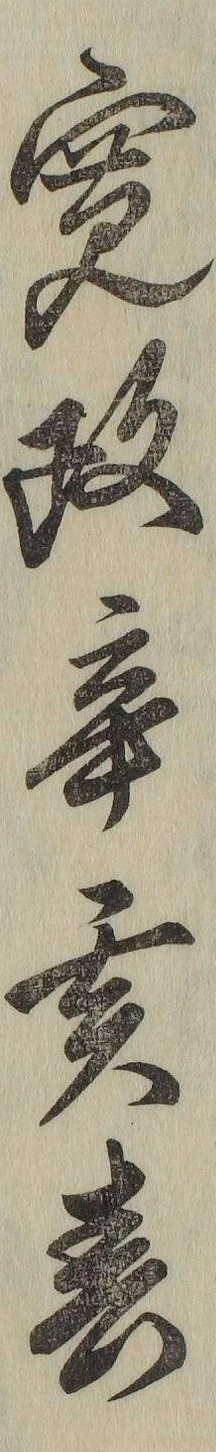寛政辛亥春
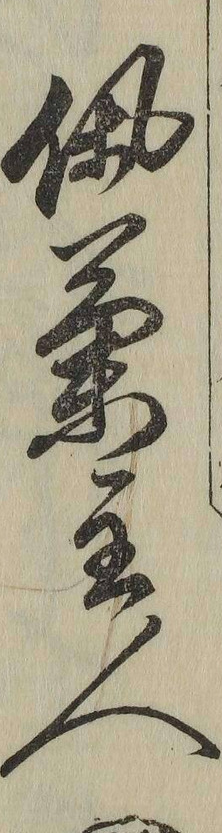佩蘭主人
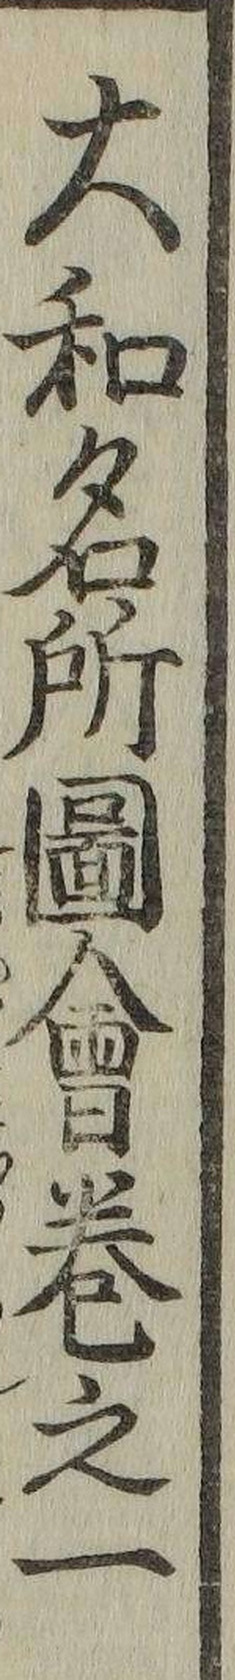大和名所圖會巻之一
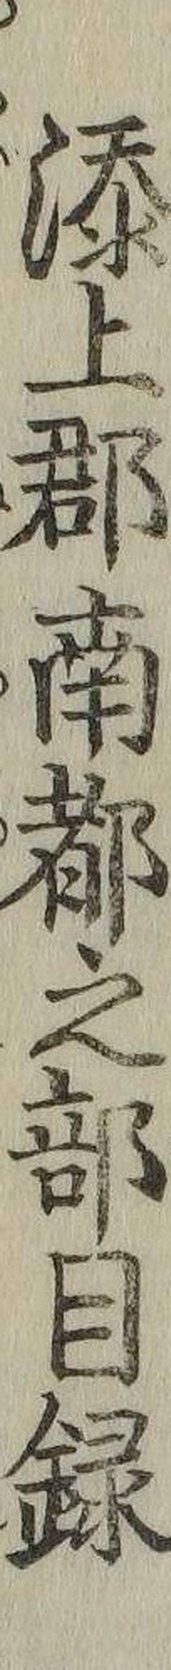添上郡南都之部目録
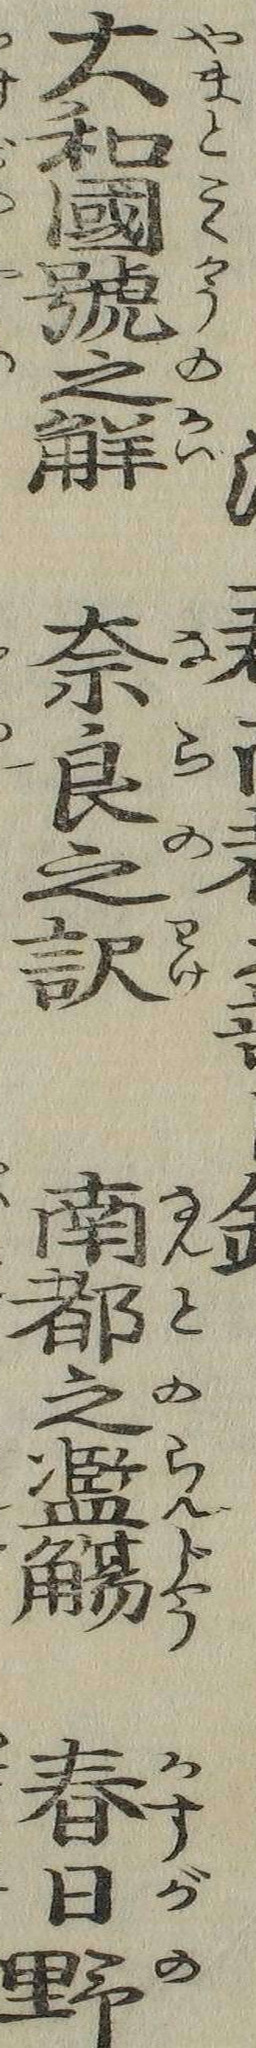大和國號之觧奈良之訳南都之濫觴春日野

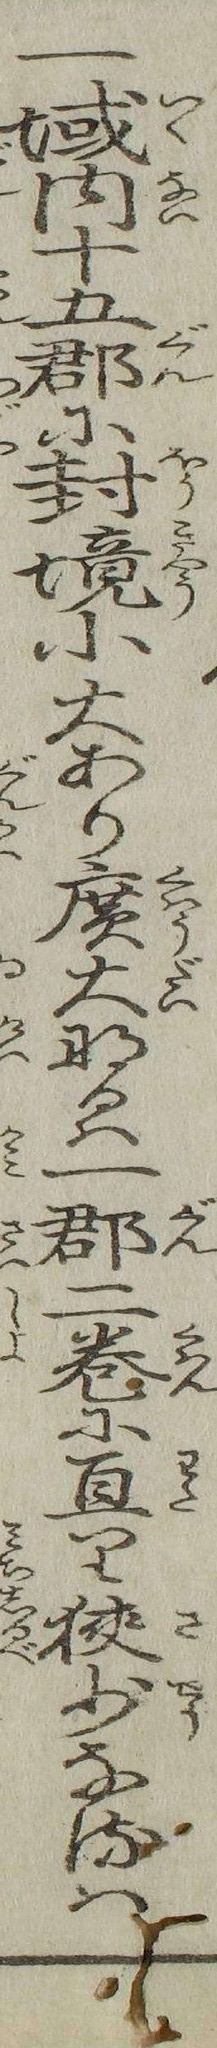一域内十五郡に封境小大あり廣大なるは一郡二巻に亙り狹少なるは
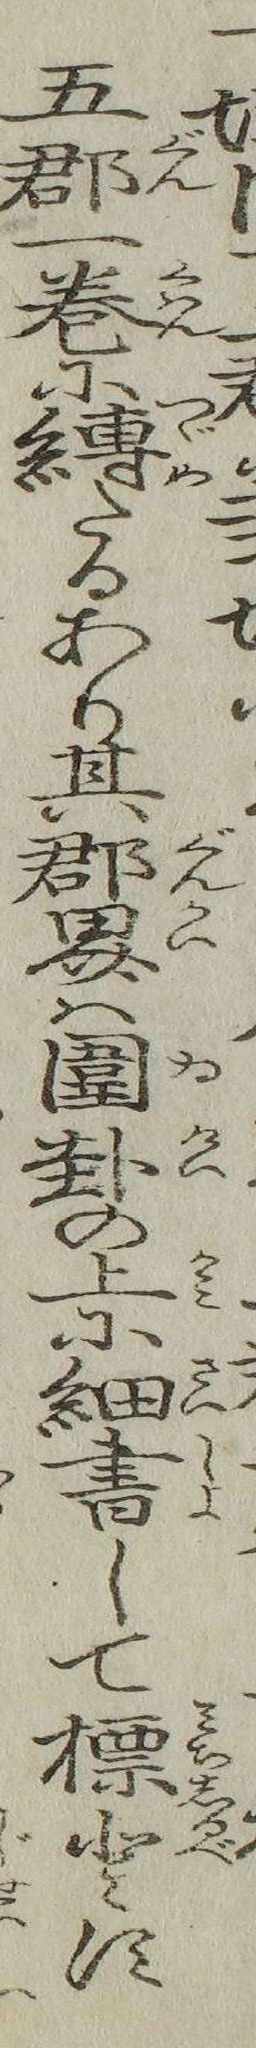五郡一巻に縳たるあり其郡界は圍卦の上に細書して標とす
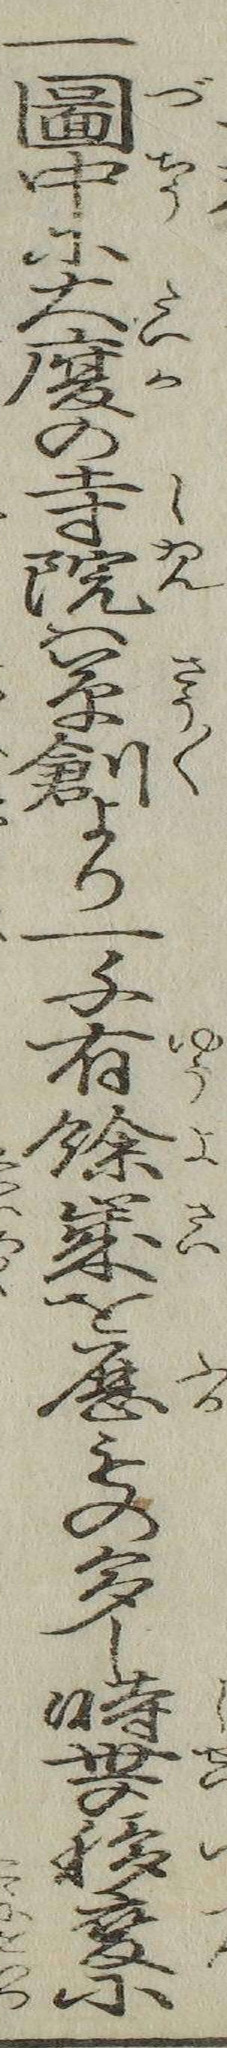一圖中に大廈の寺院は草創より一千有餘歲を歴もの多し時世の移変に
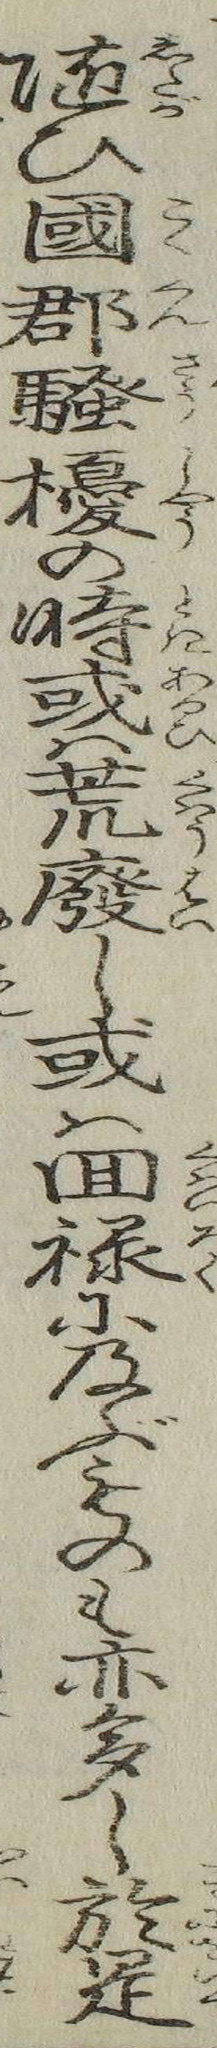随ひ國郡騷擾の時或は荒廢し或は囬禄に及ぶものも亦多し於是
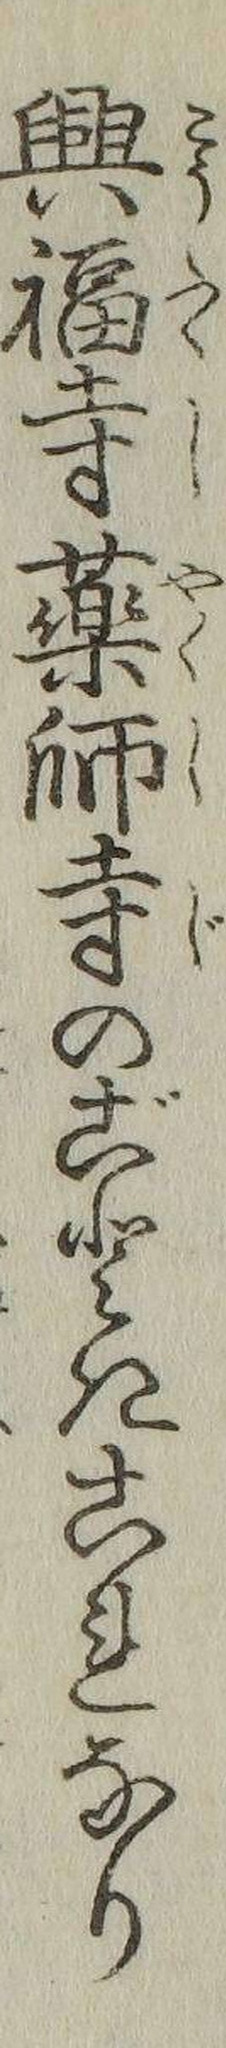興福寺藥師寺のごときこれなり
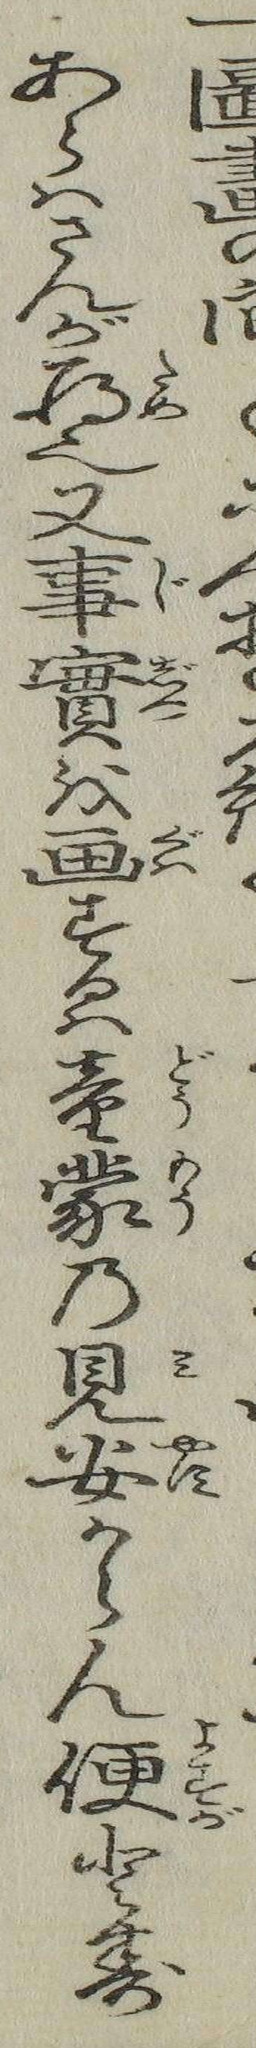あらはさんが為也又事實を画するは童蒙の見安からん便とす
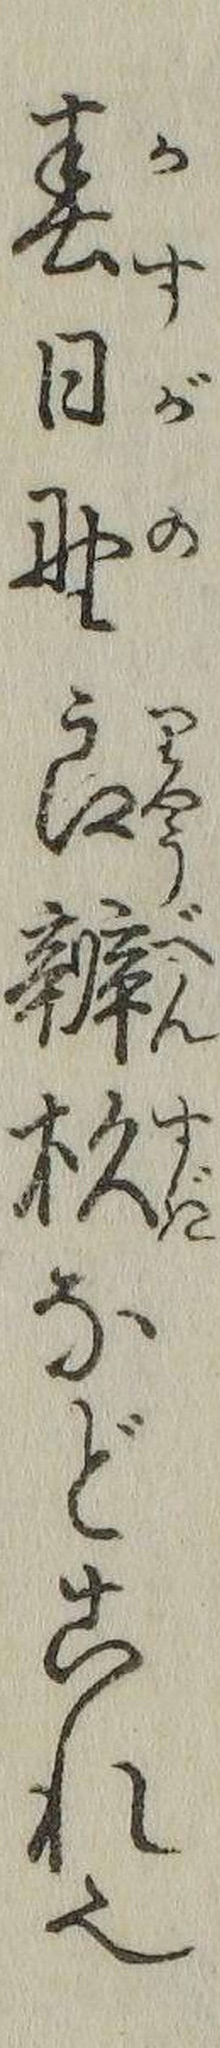春日野良辨杦などこれ也
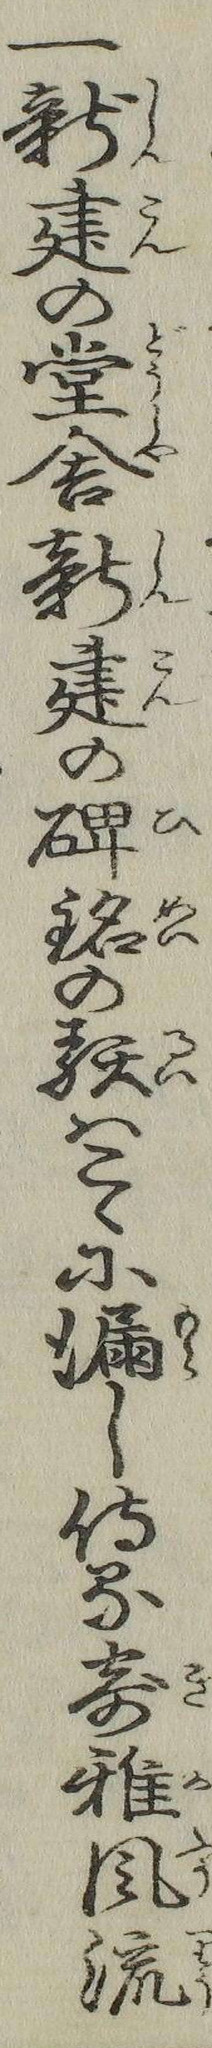一新建の堂舎新建の碑銘の類はこゝに漏し侍る奇雅風流
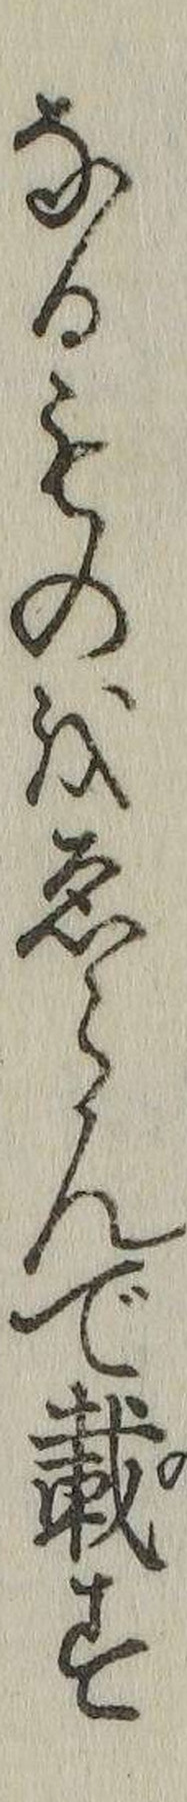なるものをゑらんで載す
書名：大和名所圖會
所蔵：国文学研究資料館
